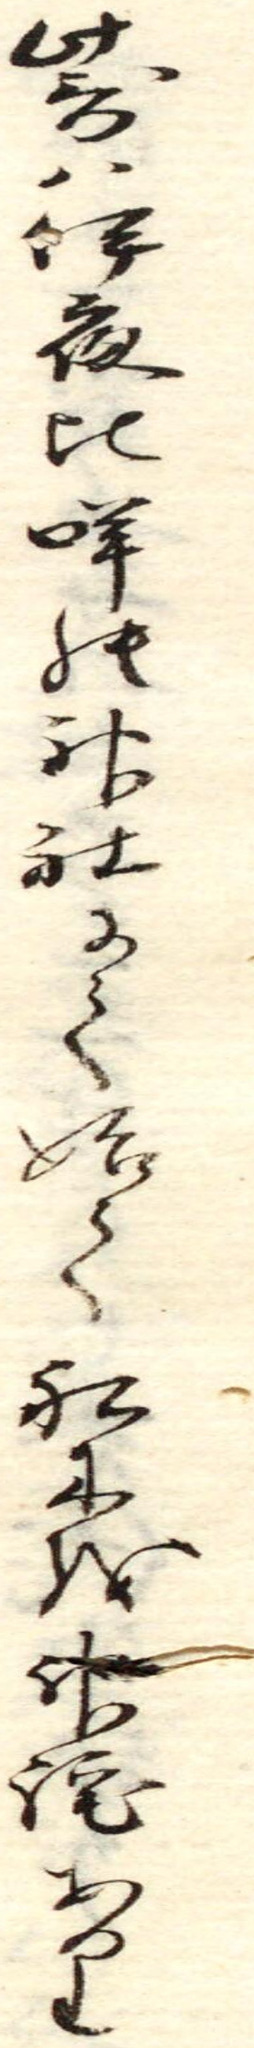此哥は伊夜比咩の神社にて始て船木を神詫あり
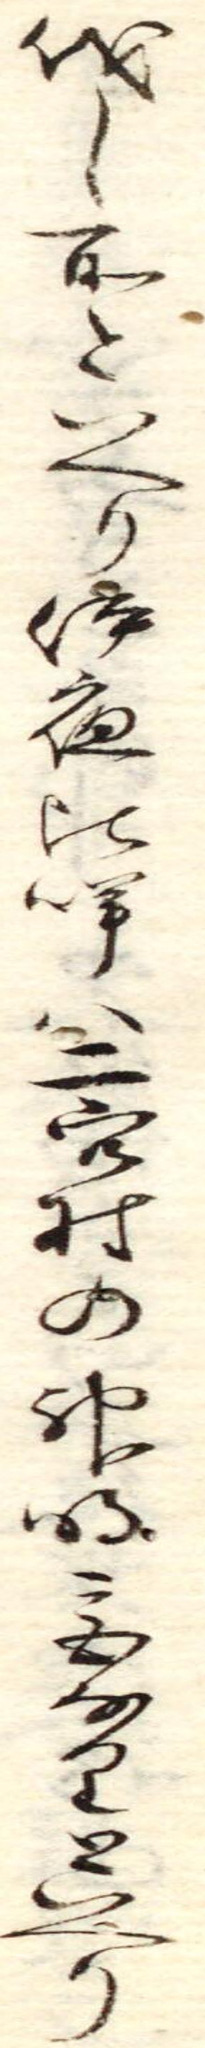伐し所といへり伊夜比咩は二穴村の神明宮なりといへり
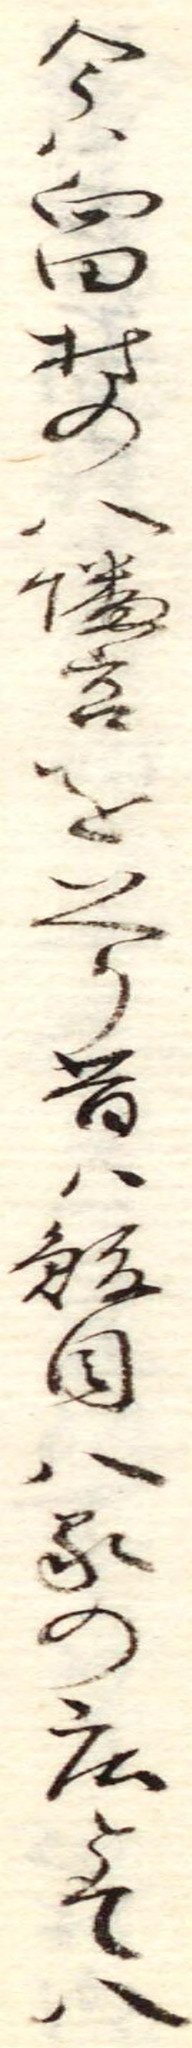今は向田村の八幡宮をいへり昔は鰀目八家の庄とて八
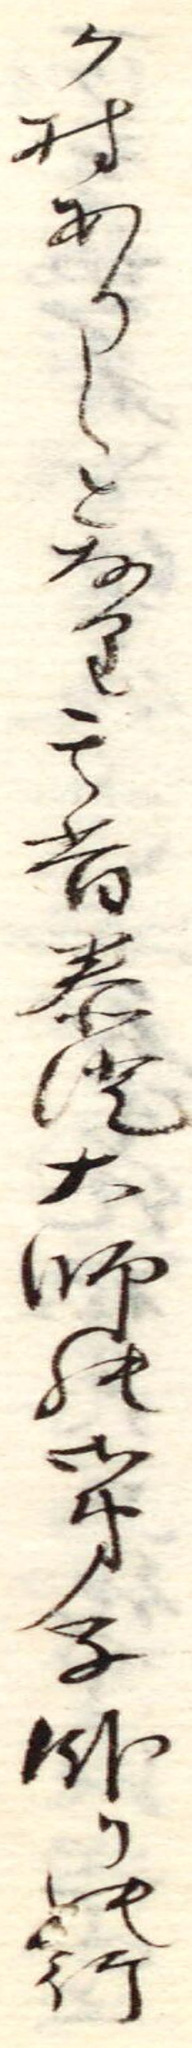ヶ村ありしとなり其昔泰澄大師の御弟子臥りの行
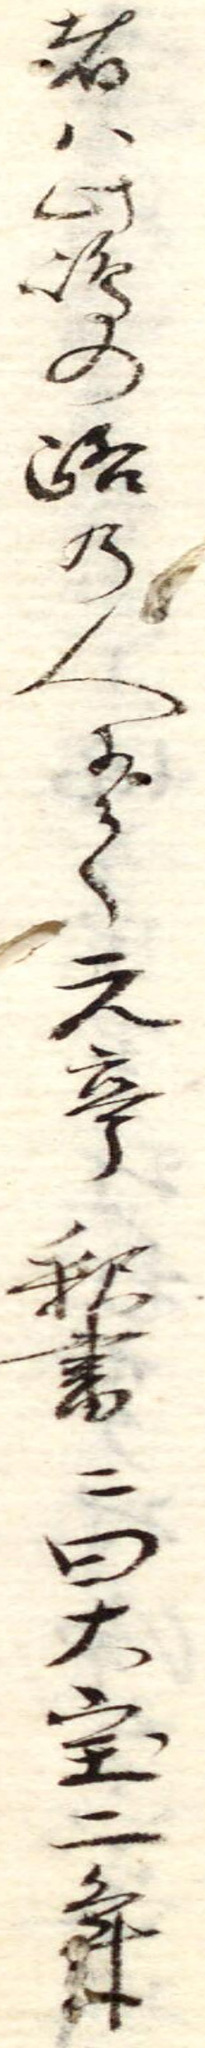者は此嶋の路の人にて元亨釈書に曰大宝二年
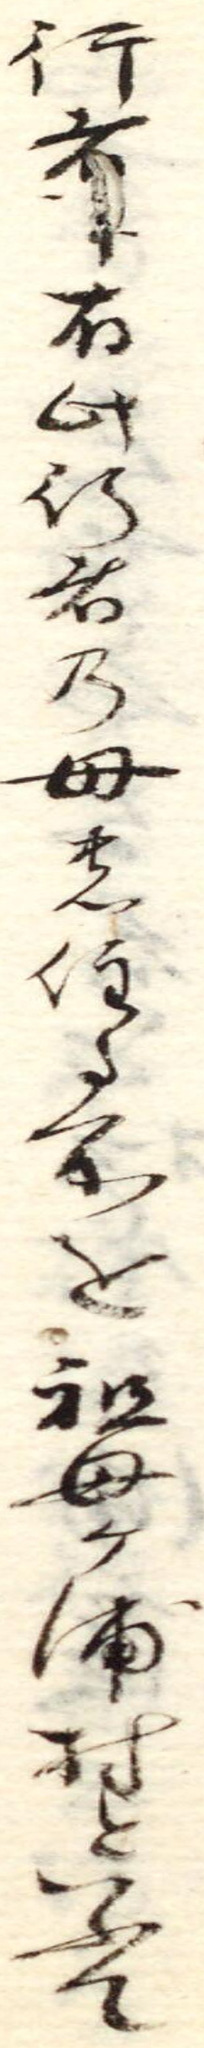行者有此行者の母の住る所を祖母ヶ浦村といふて
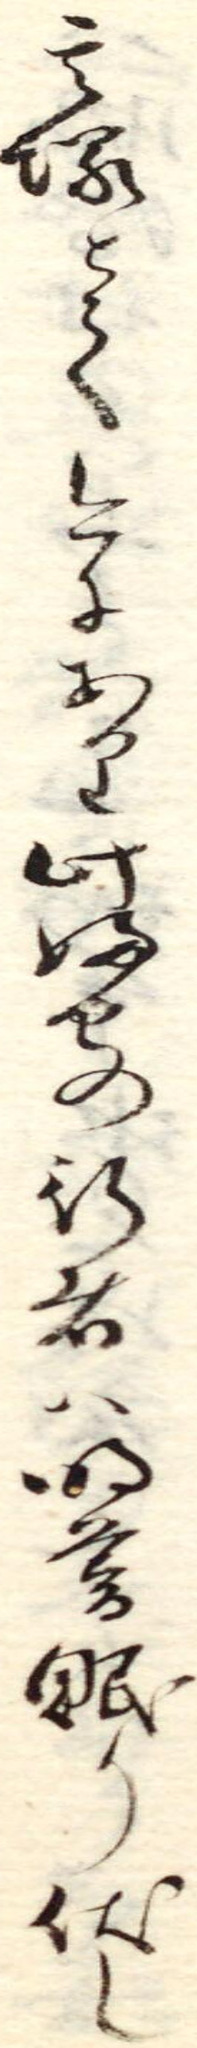其塚とて今にあり此ふせの行者は明暮眠り伏し
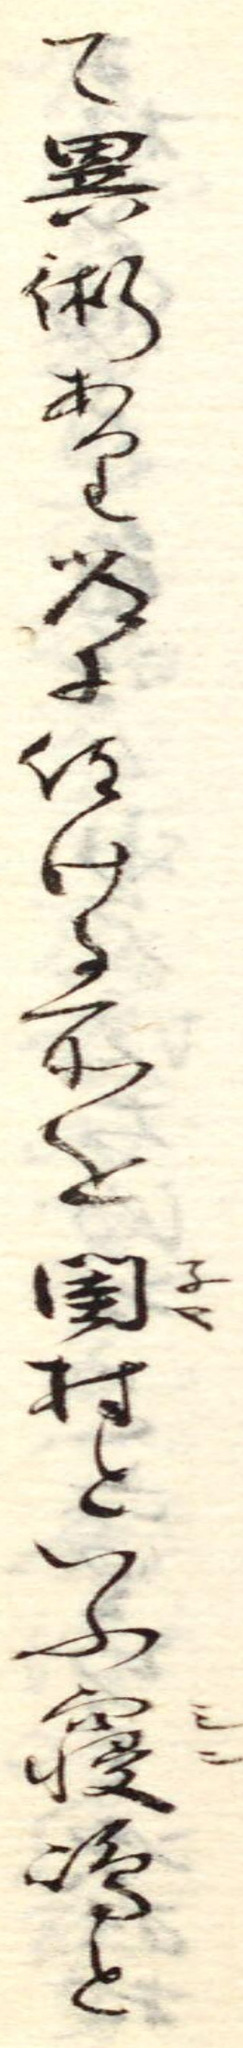て異術あり常に住ける所を閨村といふ寝嶋と
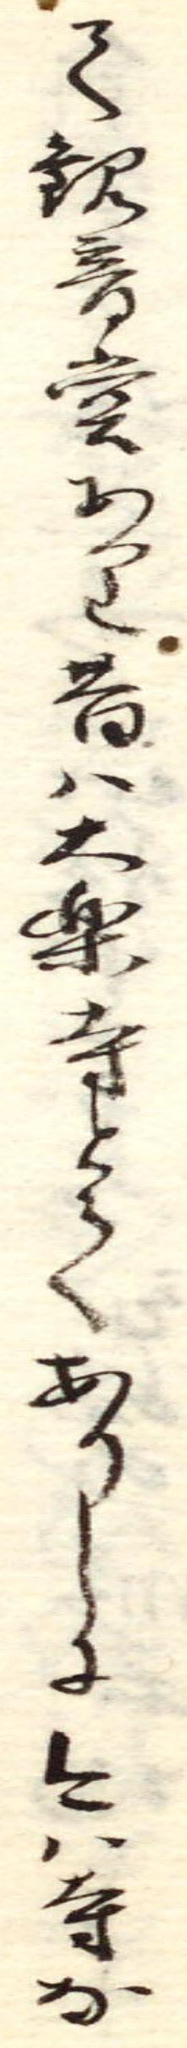て観音堂あり昔は大楽寺とてありしに今は寺な
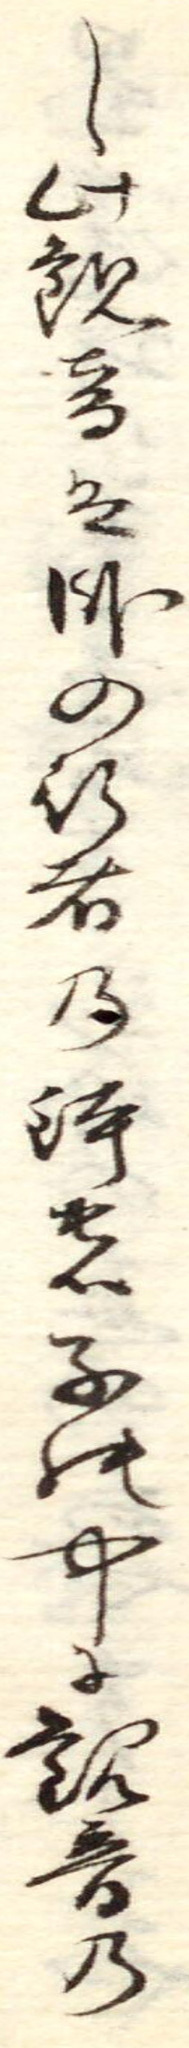し此観音は臥の行者の鉢の子の中に観音の
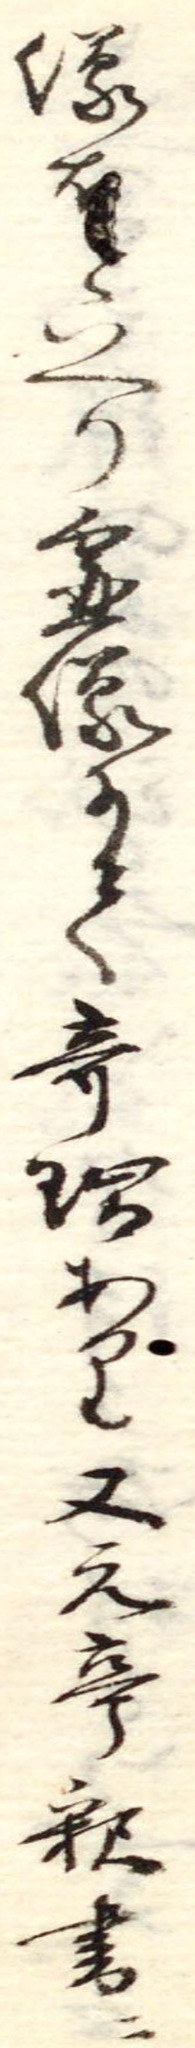像有といへり霊像にて奇瑞あり又元亨釈書に
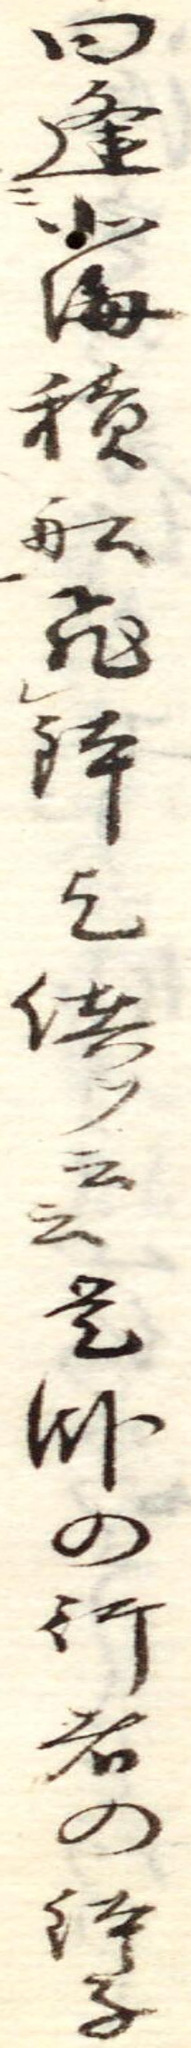曰逢北海積船飛鉢乞供云々是臥の行者の鉢子
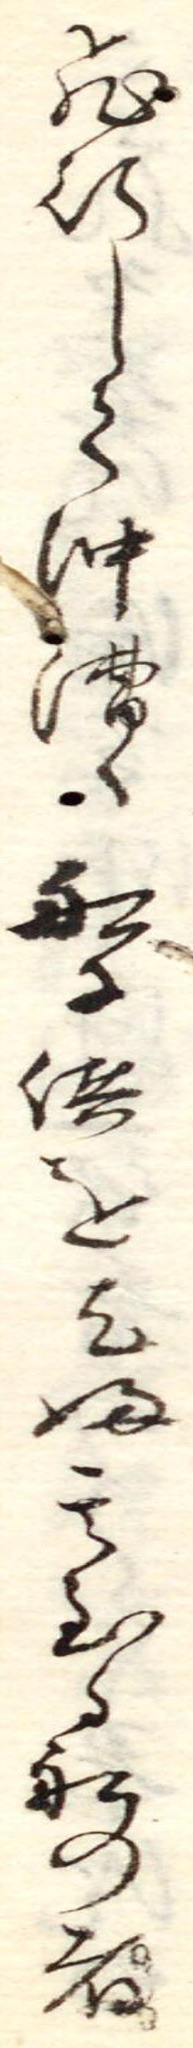飛行して沖漕く船に供を乞ふ其至る船の者
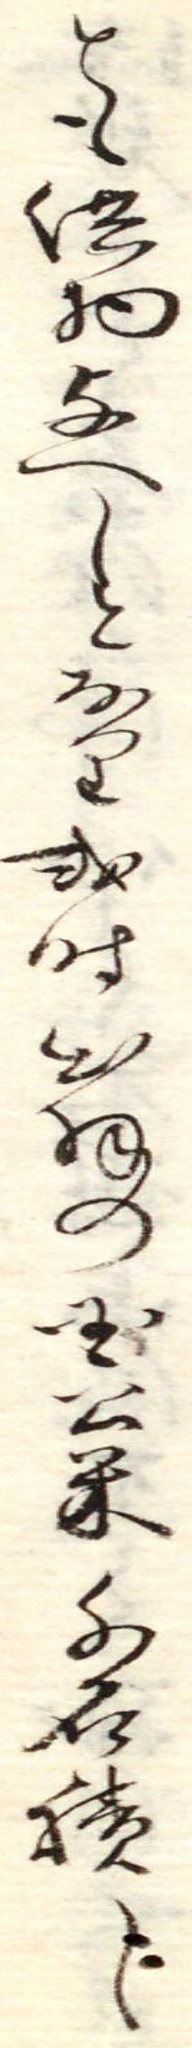とも供物与へしとなり或時出羽の国公米千石積し
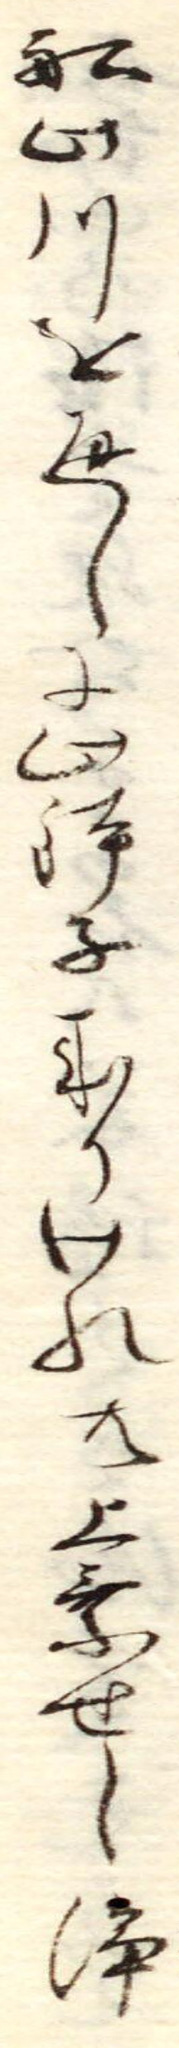船此川を通しに此鉢子来りけれ共上乗せし浄
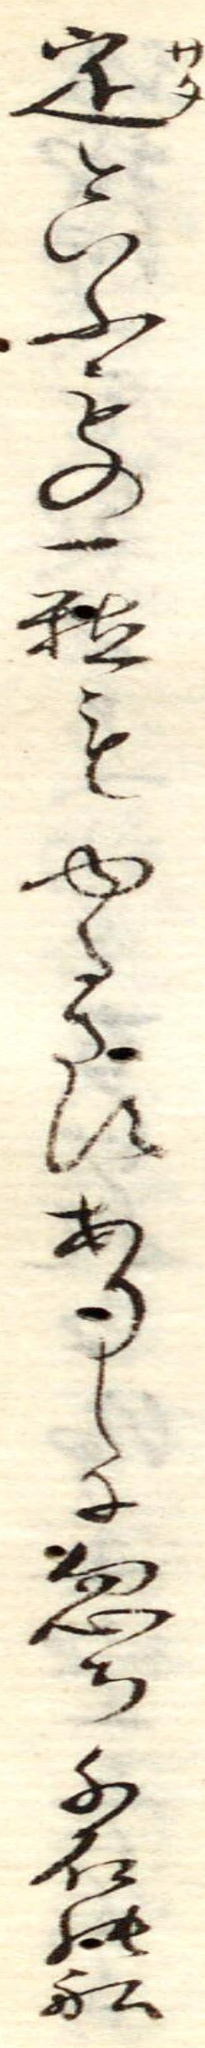定といふもの一粒もゆるさすありしに忽ち千石の船
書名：能登名跡誌
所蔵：Ishikawa Prefectural Library
